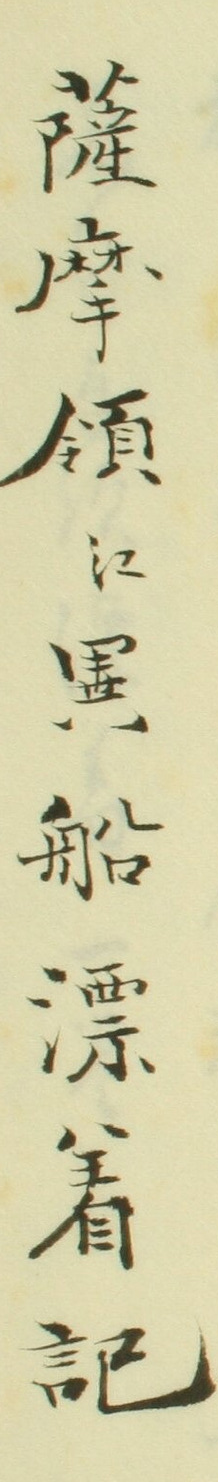薩摩領江黒船漂着記
